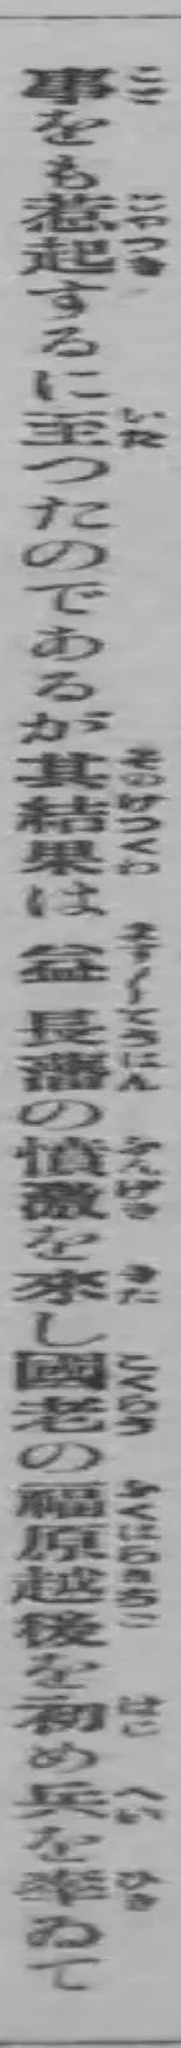事をも惹起するに至つたのであるが其結果は益長藩の憤激を来し国老の福原越後を初め兵を率ゐて
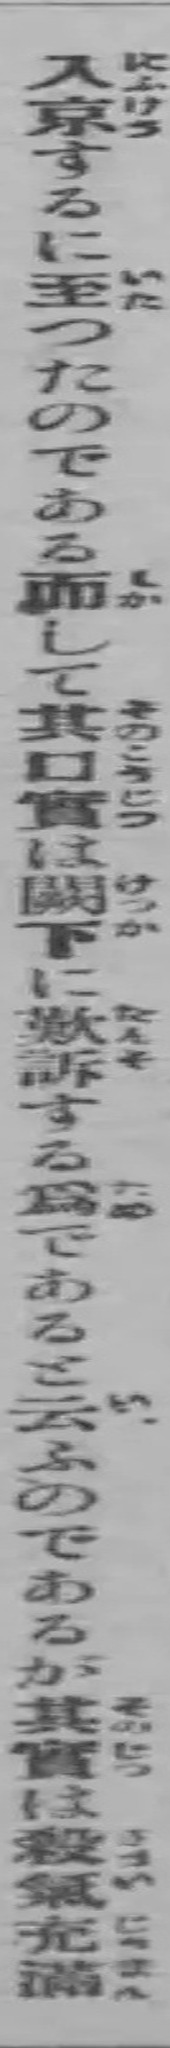入京するに至つたのである而して其口実は闕下に歎訴する為であると云ふのであるが其実は殺気充満
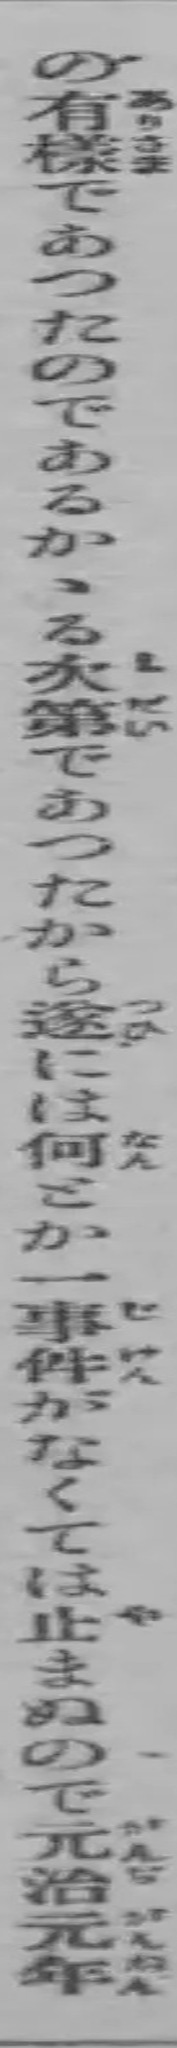の有様であつたのであるかゝる次第であつたから遂には何とか一事件がなくては止まぬので元治元年
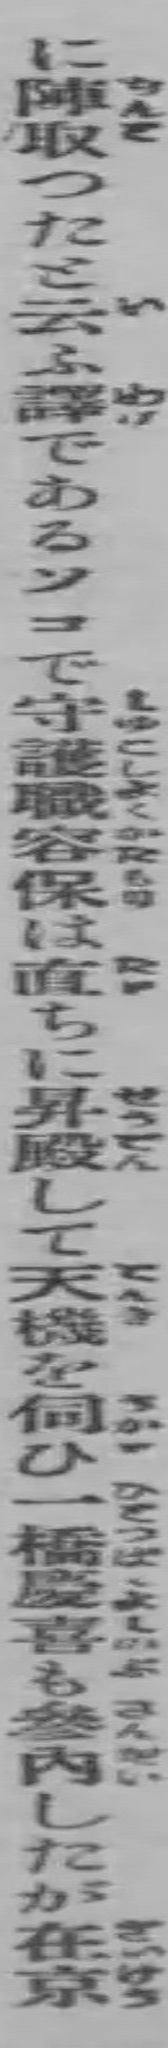に陣取つたと云ふ訳であるソコで守護職容保は直ちに昇殿して天機を伺ひ一橋慶喜も参内したが在京
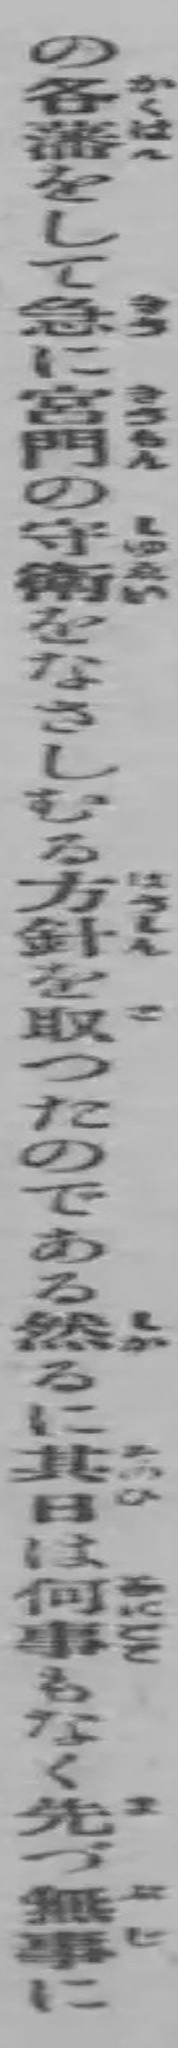の各藩をして急に宮門の守衛をなさしむる方針を取つたのである然るに其日は何事もなく先づ無事に
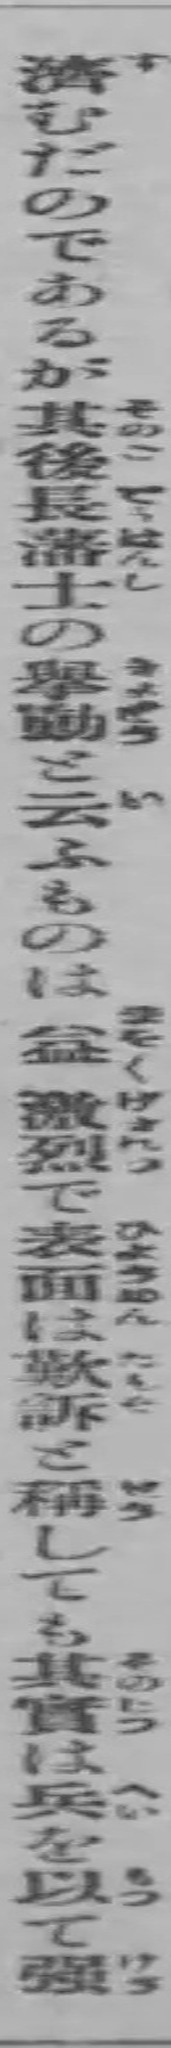済むだのであるが其後長藩士の挙動と云ふものは益激烈で表面は歎訴と称しても其実は兵を以て強
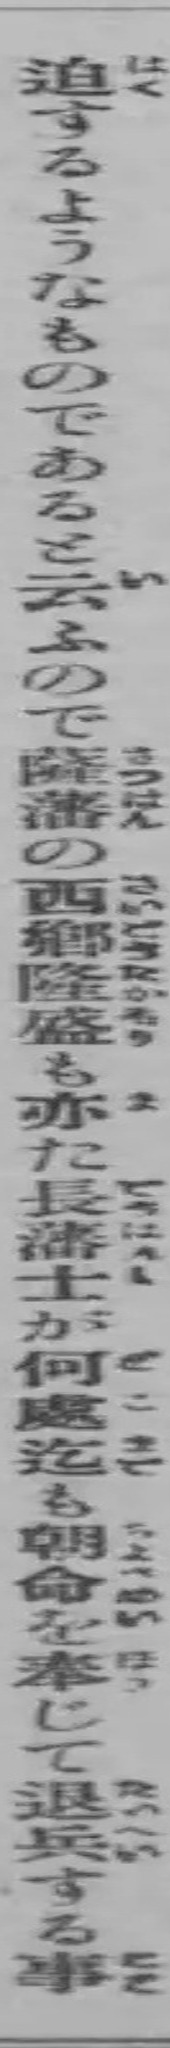迫するようなものであると云ふので薩藩の西郷隆盛も亦た長藩士が何処迄も朝命を奉じて退兵する事
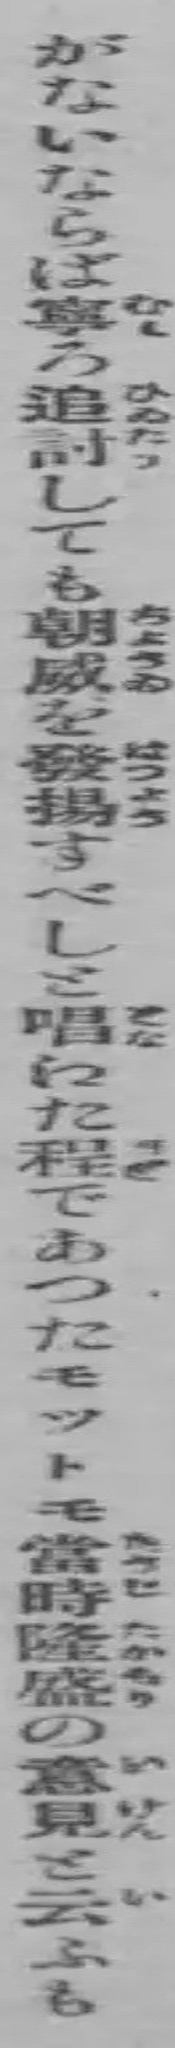がないならば寧ろ追討しても朝威を発揚すべしと唱えた程であつたモツトモ当時隆盛の意見と云ふも
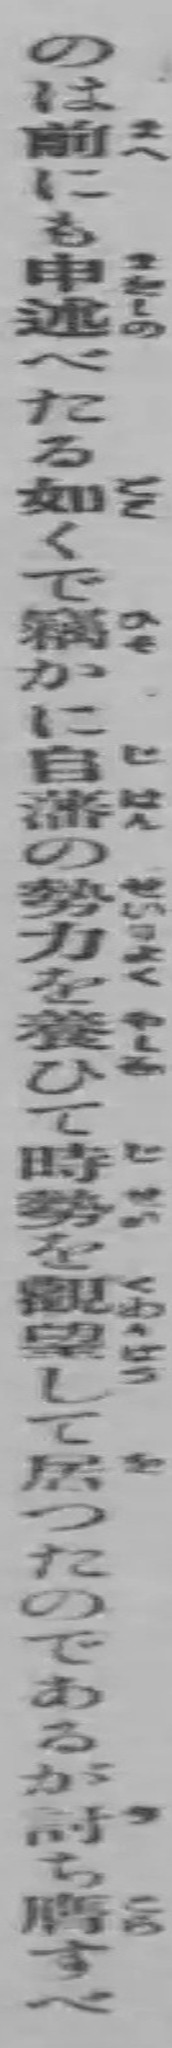のは前にも申述べたる如くで竊かに自藩の勢力を養ひて時勢を観望して居つたのであるが討ち膺すべ
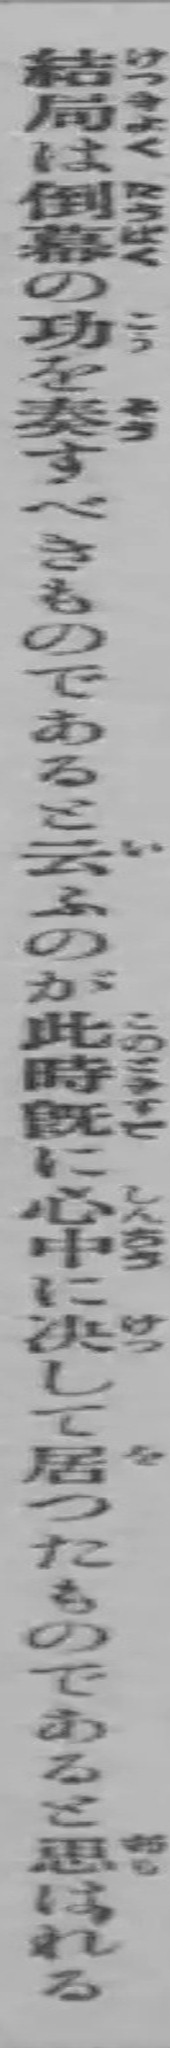結局は討幕の功を奏すべきものであると云ふのが此時既に心中に決して居つたものであると思はれる
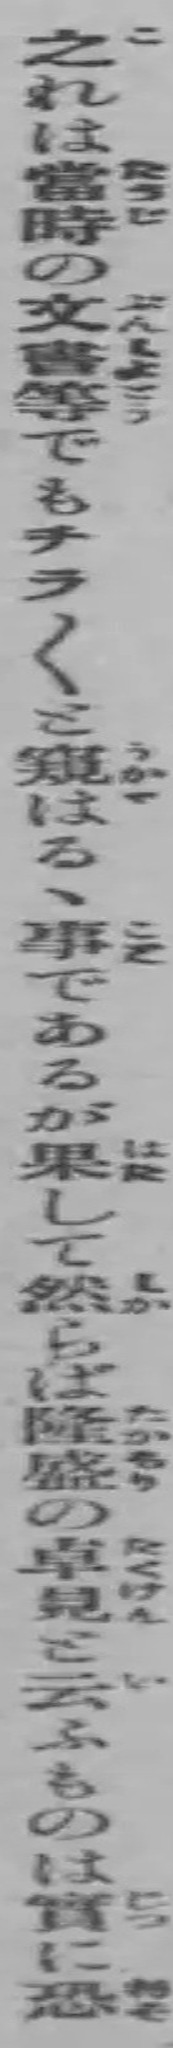之れは当時の文書等でもチラ〳〵と窺はるゝ事であるが果して然らば隆盛の卓見と云ふものは実に恐
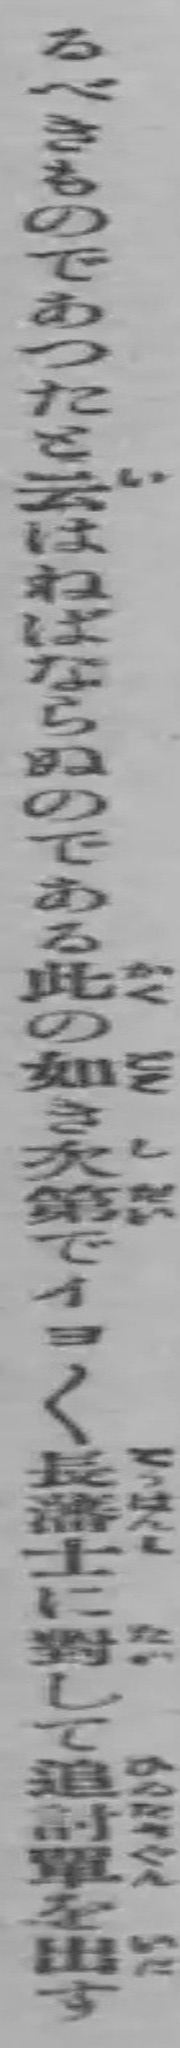るべきものであつたと云はねばならぬのである此の如き次第でイヨ〳〵長藩士に対して追討軍を出す

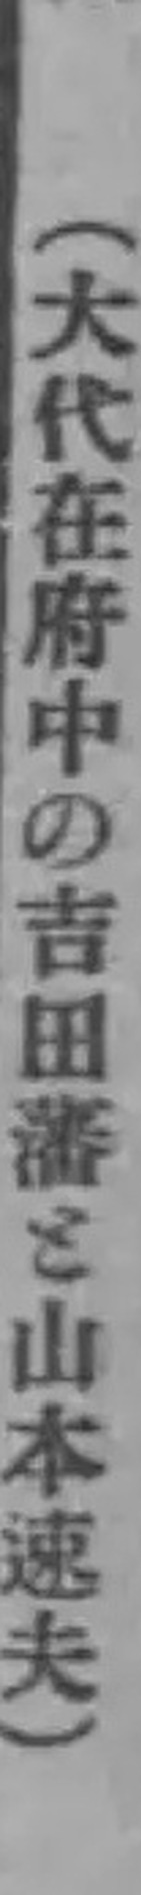⦿大阪在府中の吉田藩と山本速夫
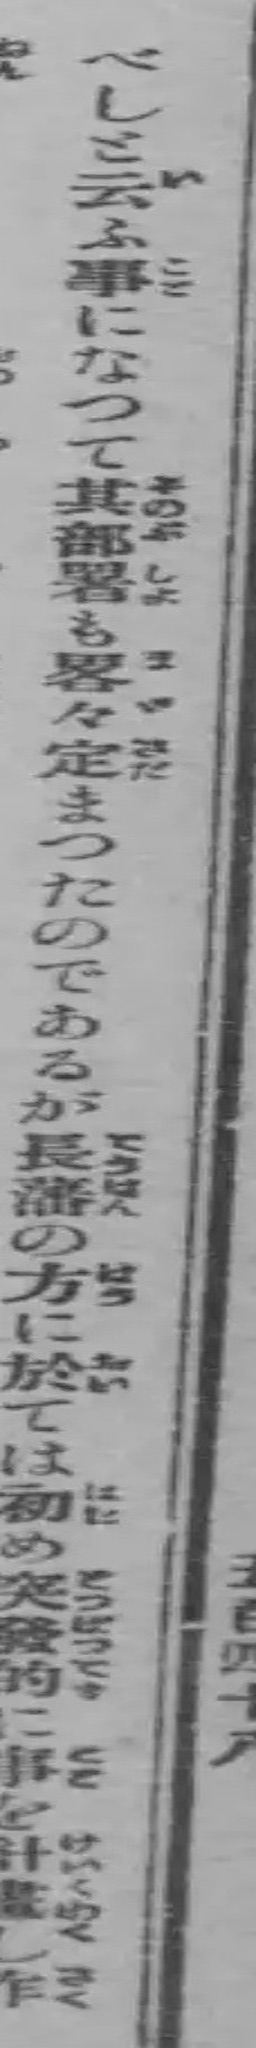べしと云ふ事になつて其部署も略々定まつたのであるが長藩の方に於ては初め突発的に事を計画し昨
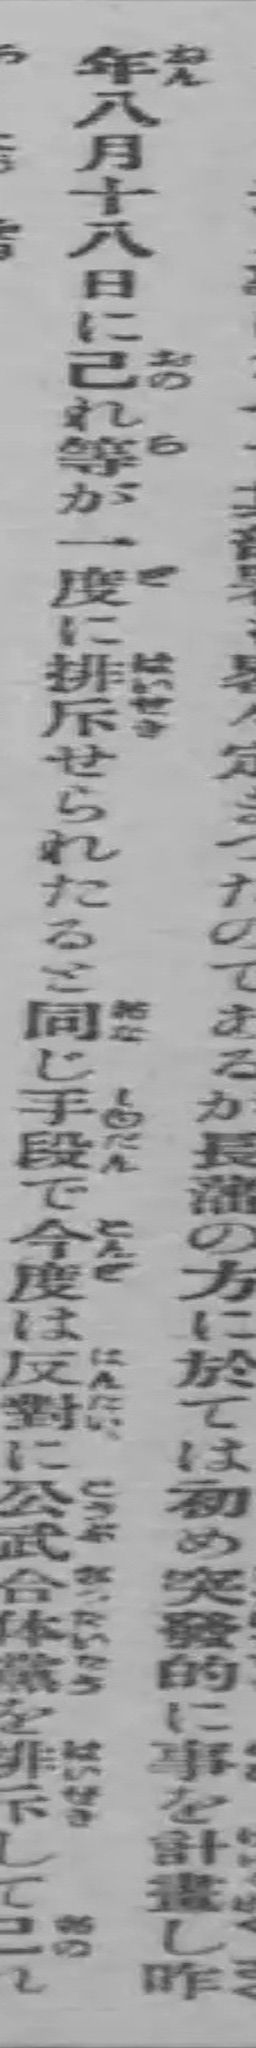年八月十八日に己れ等が一度に排斥せられたると同じ手段で今度は反対に公武合体党を排斥して己れ
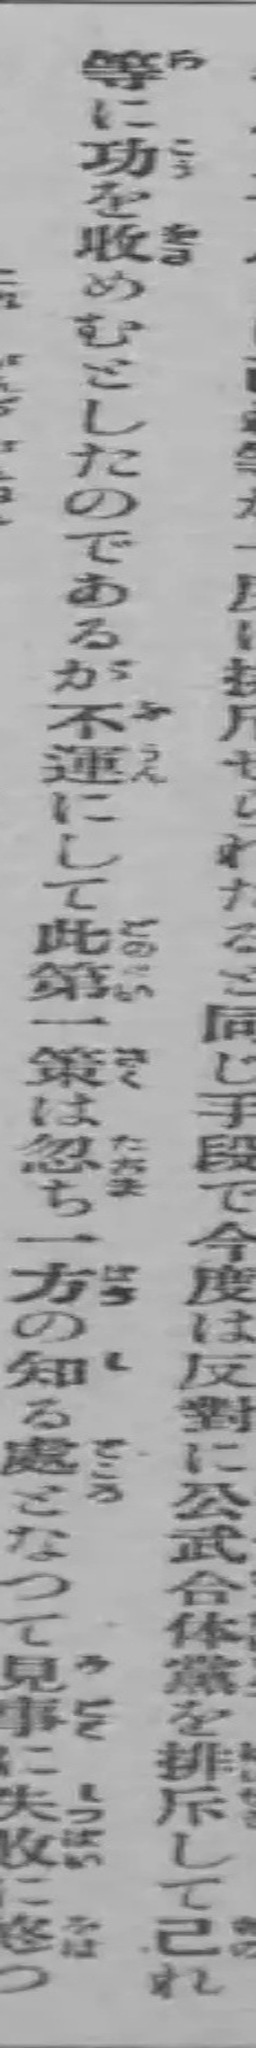等に功を収めむとしたのであるが不運にして此第一策は忽ち一方の知る処となつて見事に失敗に終つ
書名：豊橋市史談
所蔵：国立国会図書館 National Diet Library, JAPAN
